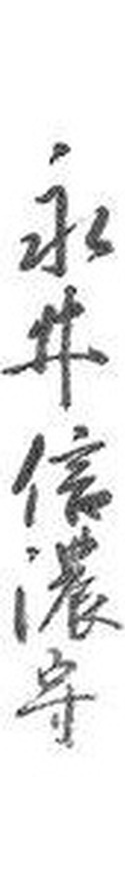永井信濃守
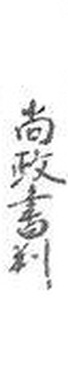尚政書判
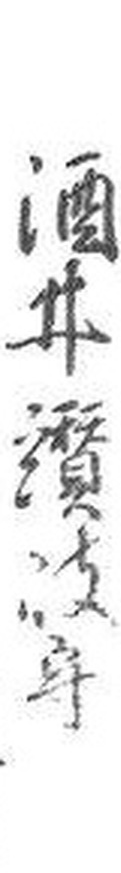酒井讃岐守
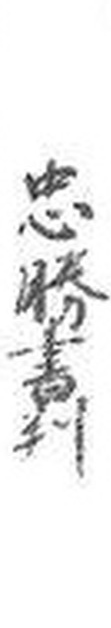忠勝書判
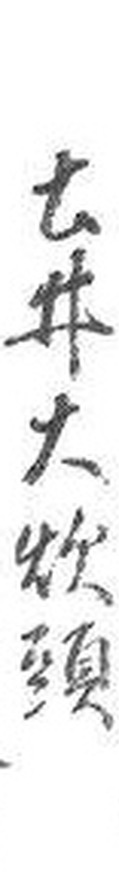土井大炊頭
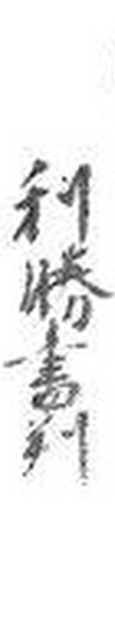利勝書判
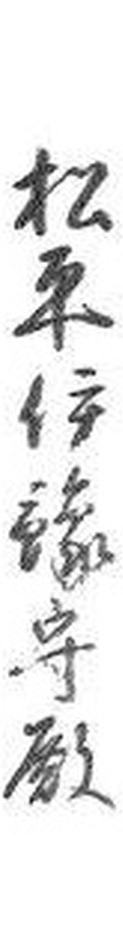松平伊予守殿
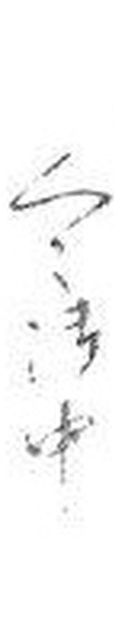人々御中
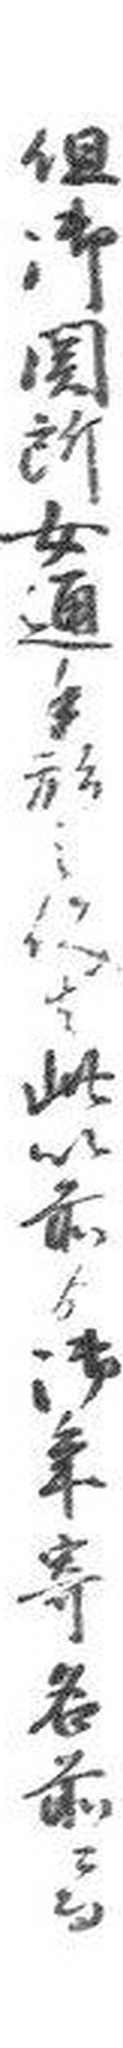但御関所女通手形之儀は此以前ゟ御年寄名前ニ而
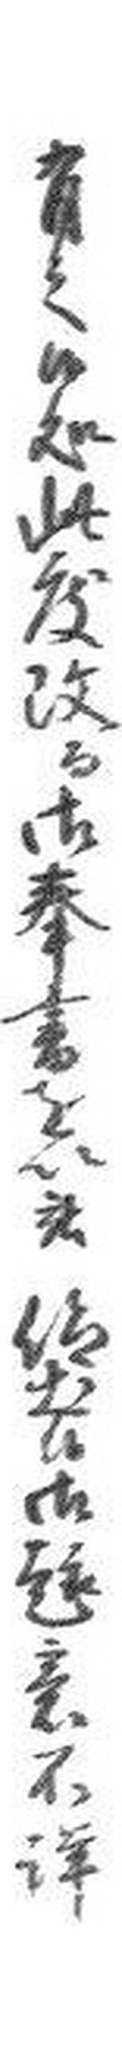有之候処此度改而御奉書を以被仰出候御趣意不詳
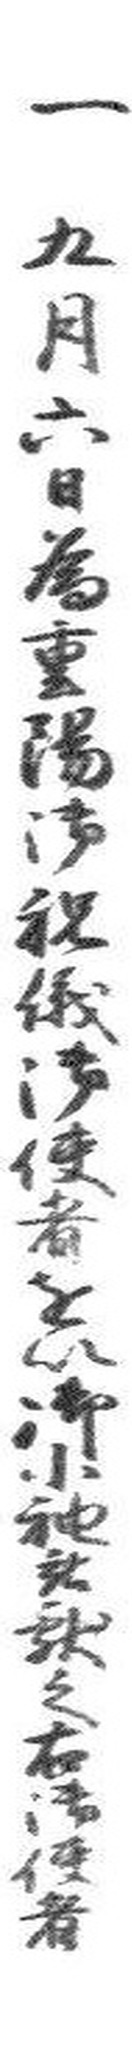一九月六日為重陽御祝儀御使者を以御小袖被献之右御使者
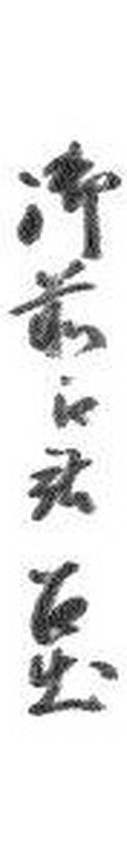御前江被召出
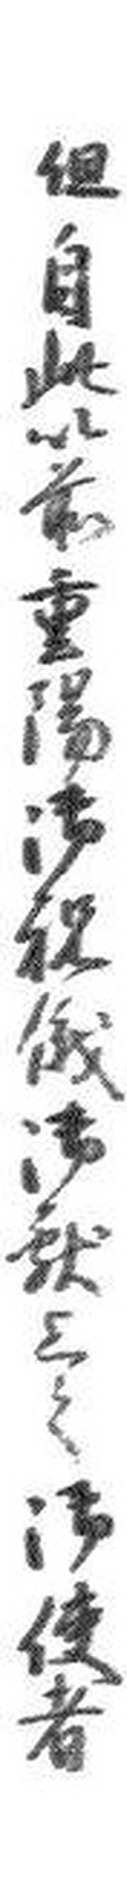但自此以前重陽御祝儀御献上之御使者
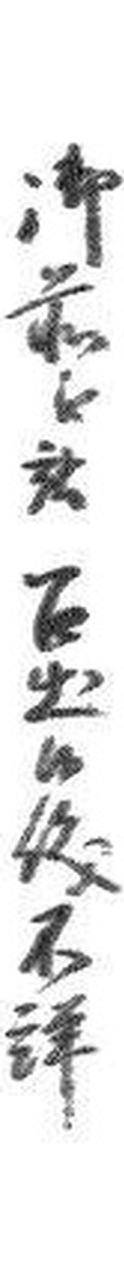御前江被召出候儀不詳
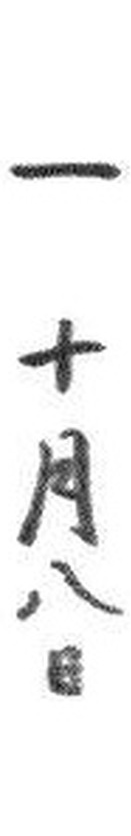一十月八日
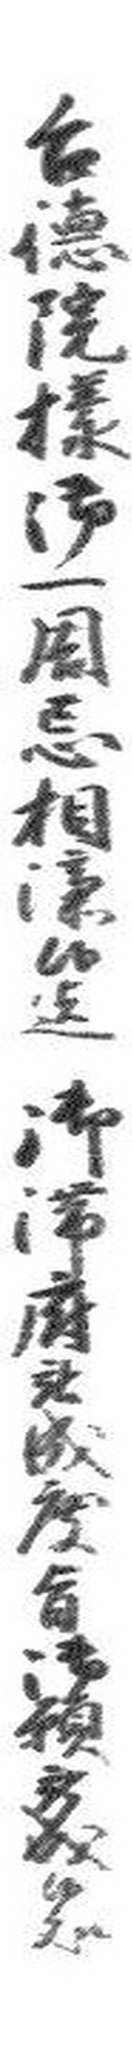台徳院様御一周忌相済候迄御滞府被成度旨御願被成候処
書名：家譜 四 忠昌公 従寛永七年到正保四年
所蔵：福井県文書館 Fukui Prefectural Archives
